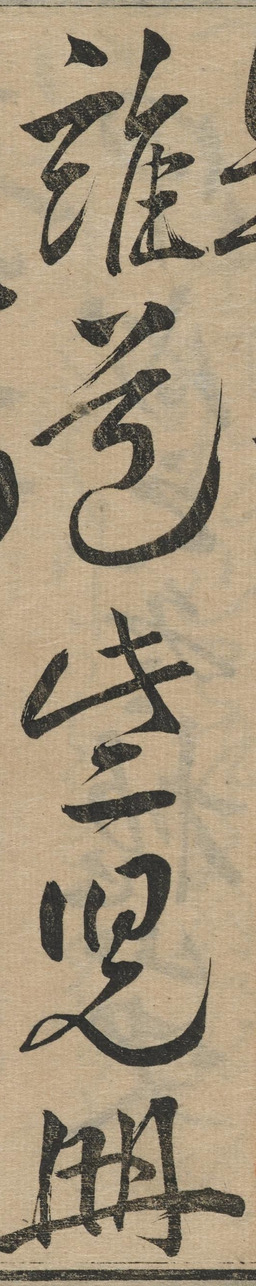誰道些児冊
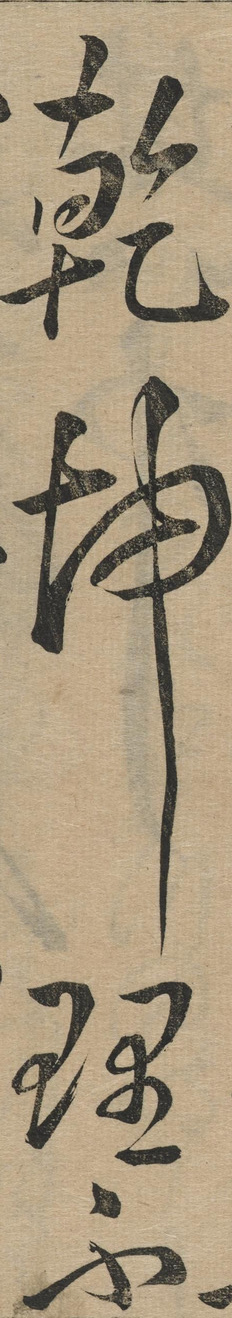乾坤理不
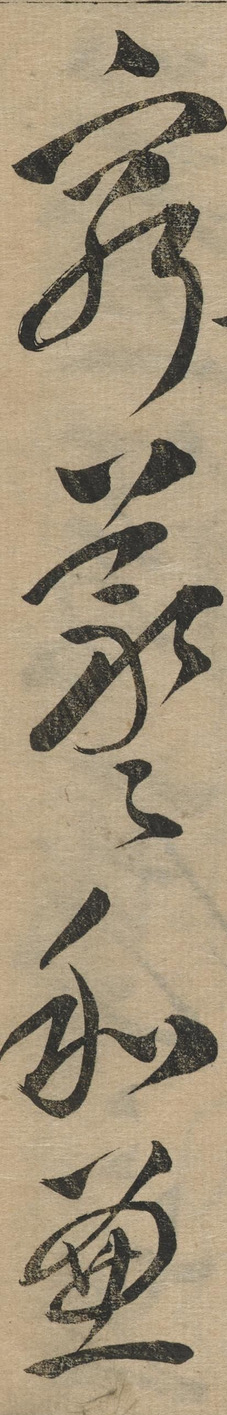窮蒙々和兼

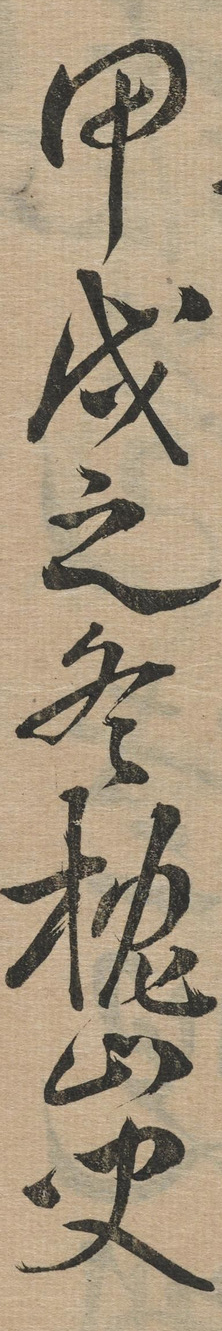甲戌之冬枕山史
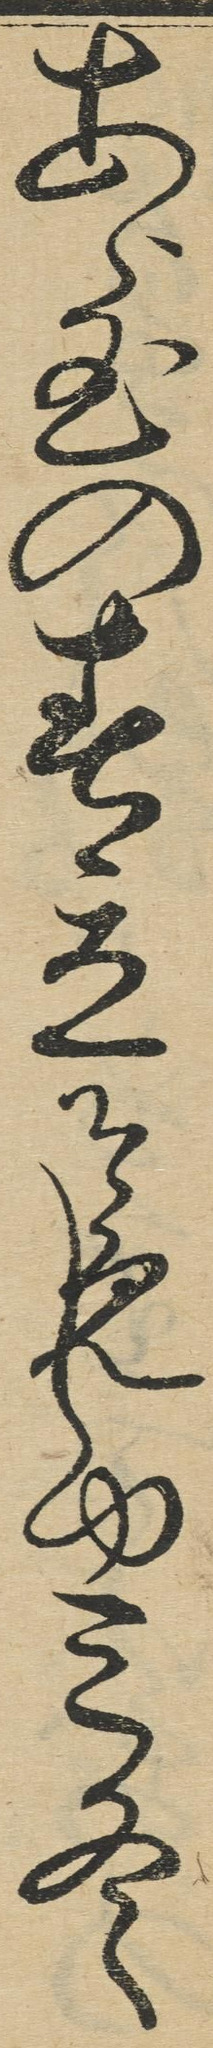あら玉の春立そめしゆみ冬
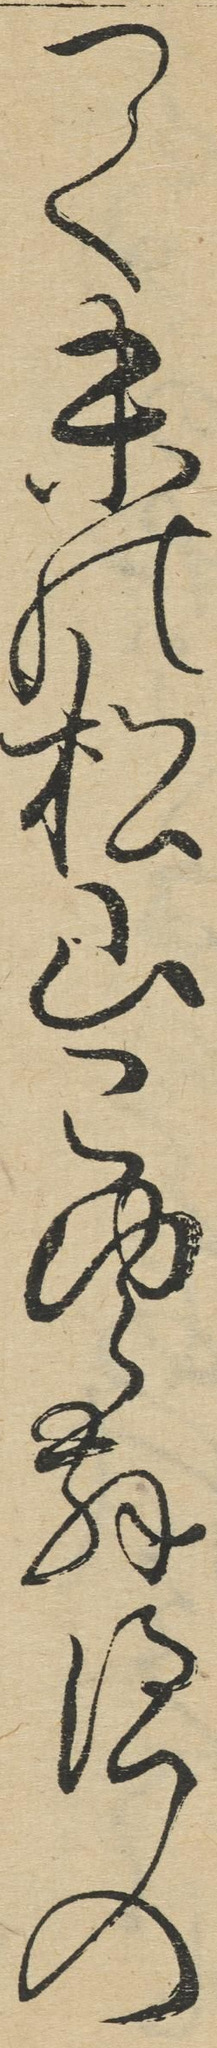つく末の松山こゆる敷浪の
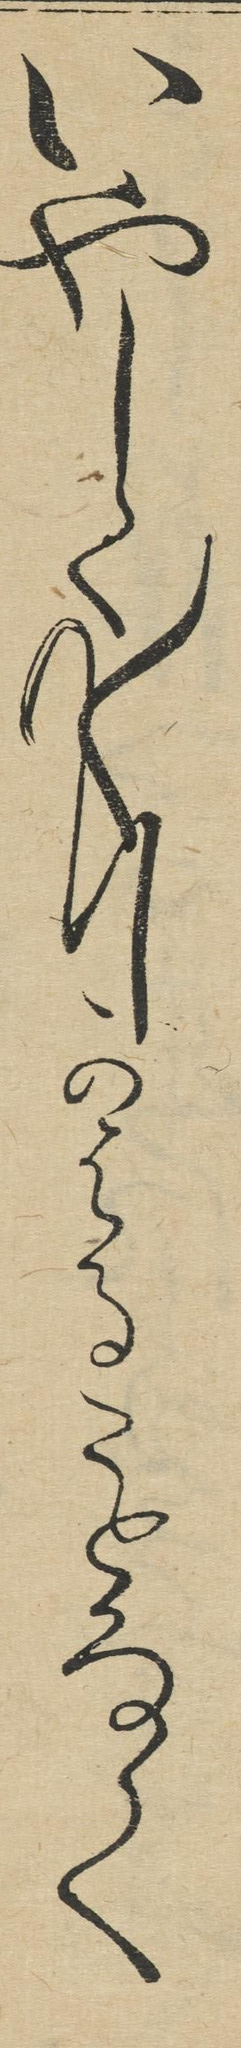いやしく〳〵にかはることなく
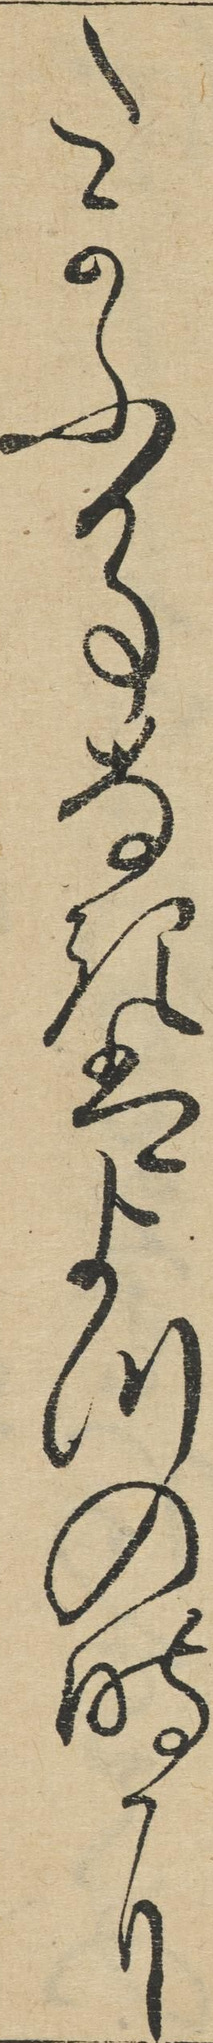たかふ事なきはよつの時に
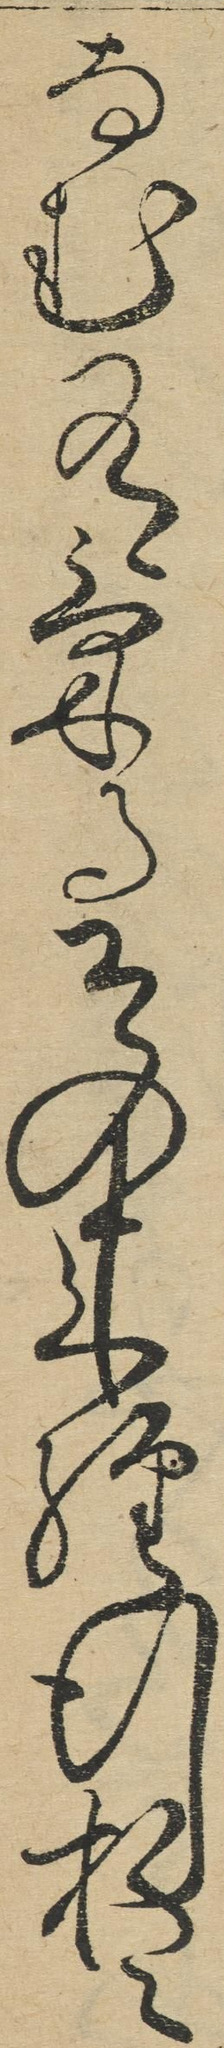なむ有けるその来経行折々
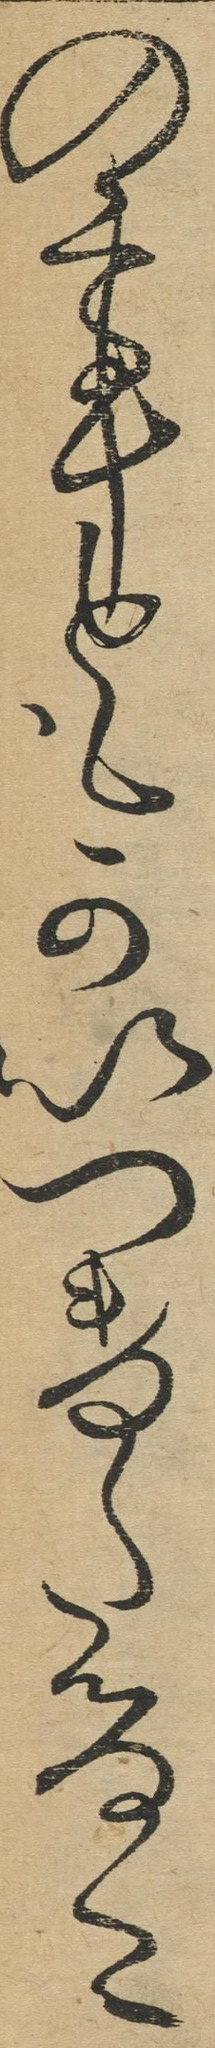の事ともかいつけたるこ

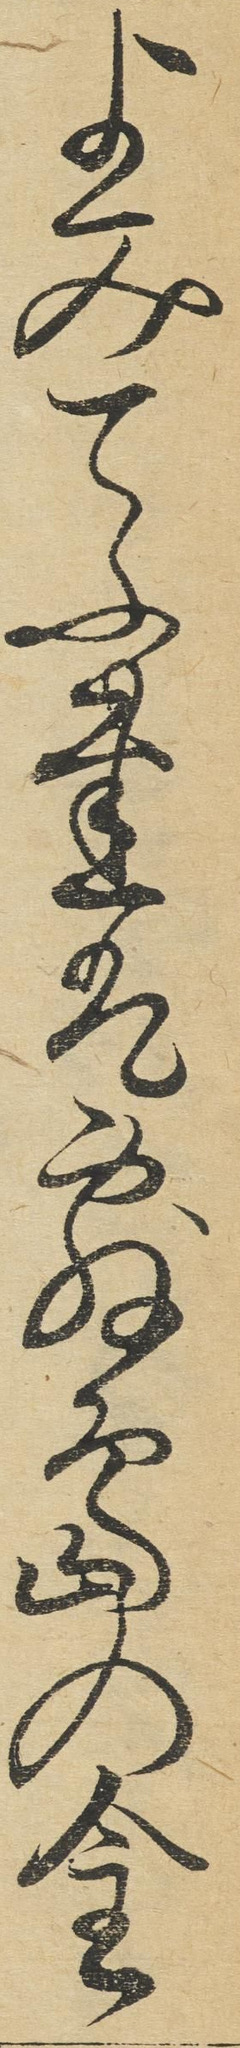よみてふ書は敷島の金
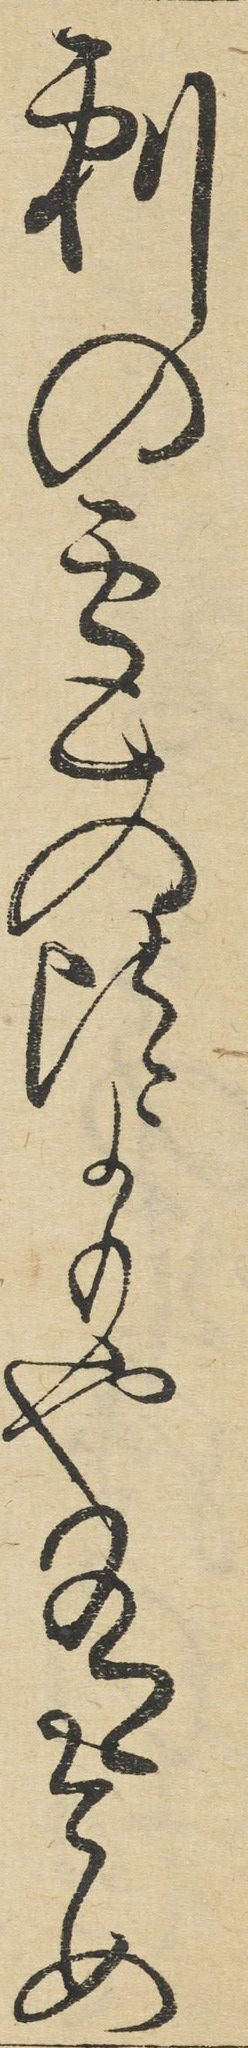刺の宮の頃よりや有りそめ
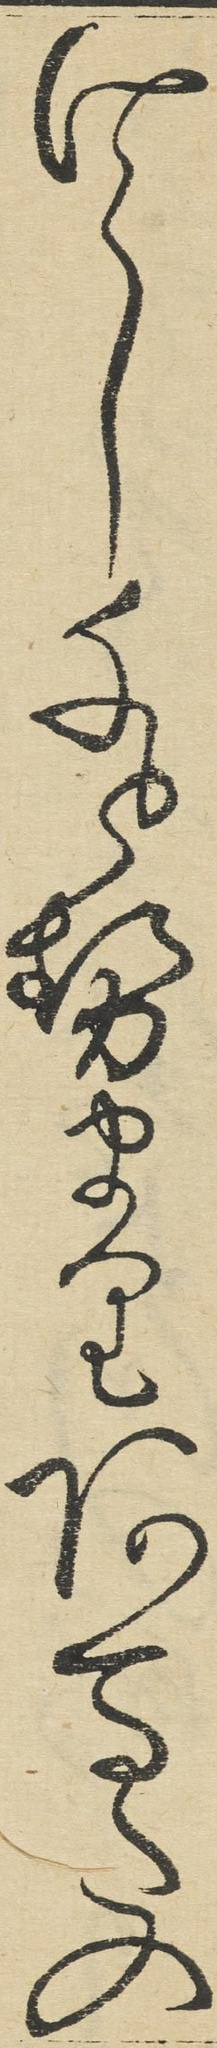けらし千とせまりあまたの
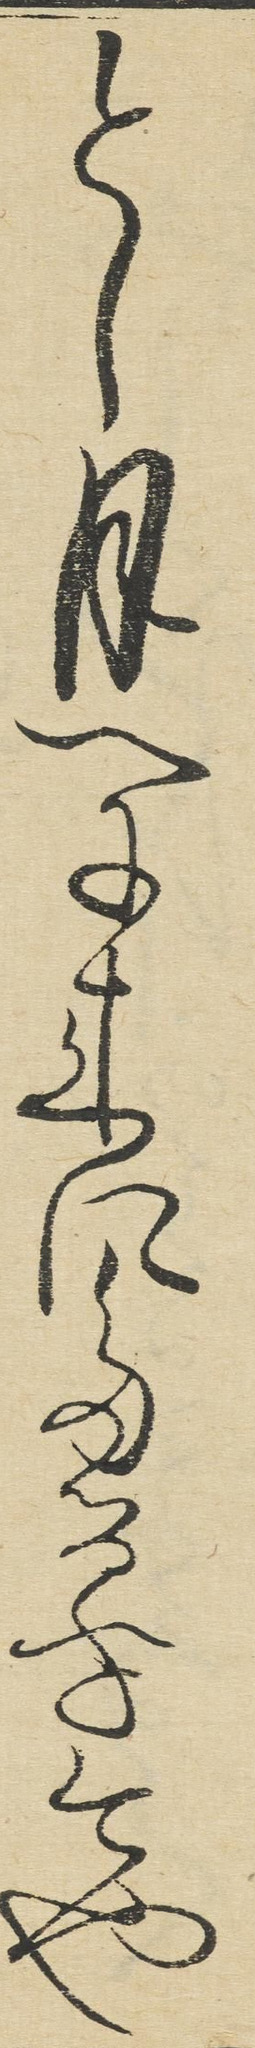とし月へに来にたるまてや
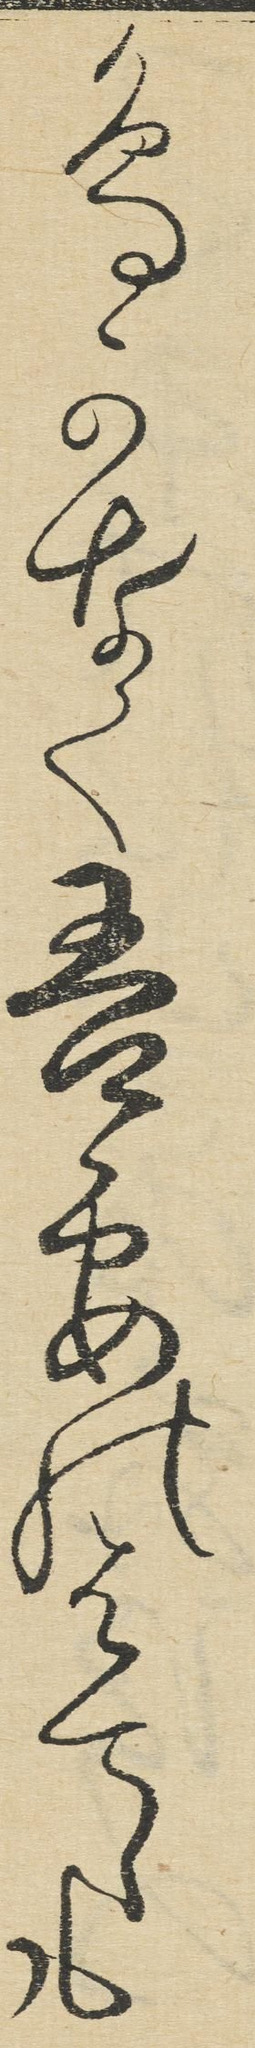鳥かなく吾妻のはてしも
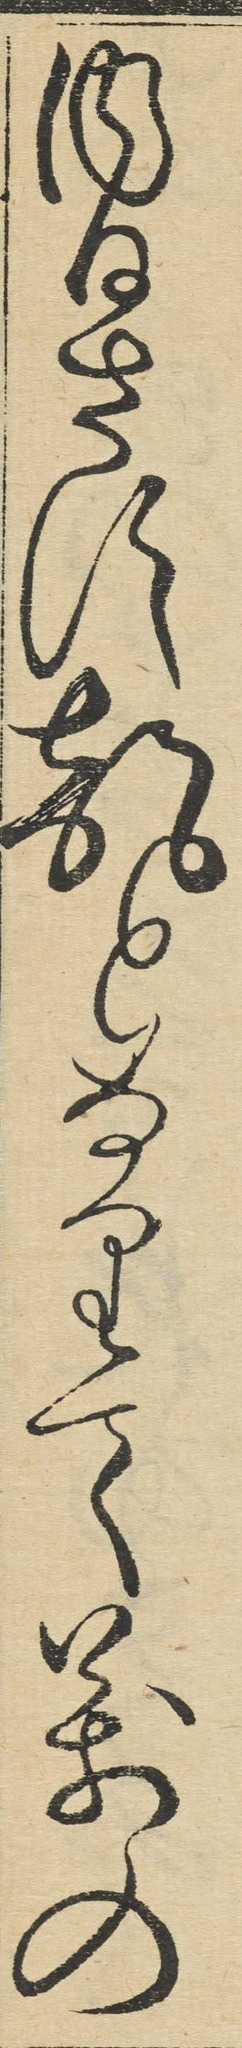内日さす都となりて万の
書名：暦日往来　單
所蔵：東京大学地震研究所図書室 Earthquake Research Institute Library, The University of Tokyo, JAPAN
